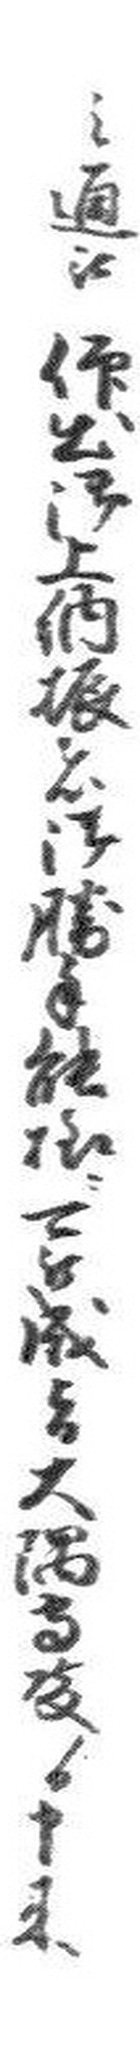之通被仰出御上納振者御勝手能様ニ可被成旨大隅守殿ゟ申来
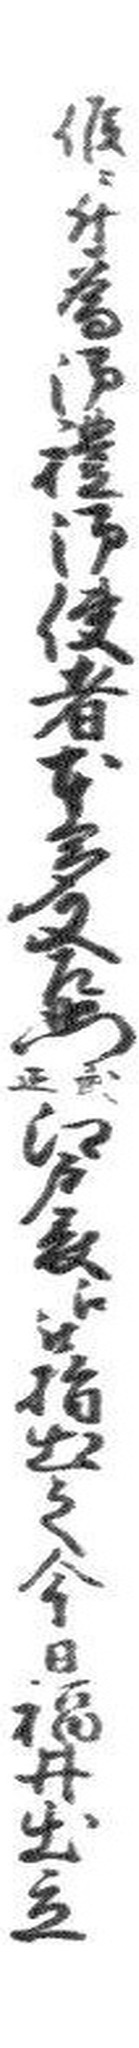候ニ付為御礼御使者本多又左衛門武正江戸表江被指出之今日福井出立
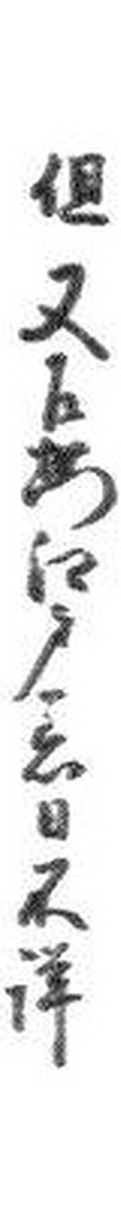但又左衛門江戸着日不詳

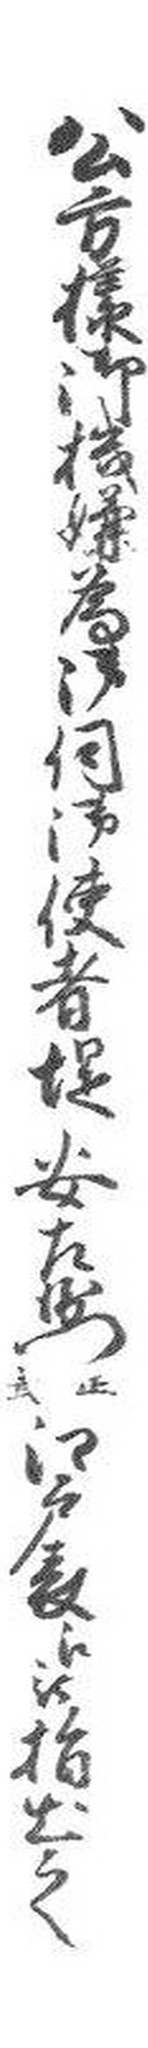公方様御機嫌為御伺御使者堤安左衛門正武江戸表江被指出之
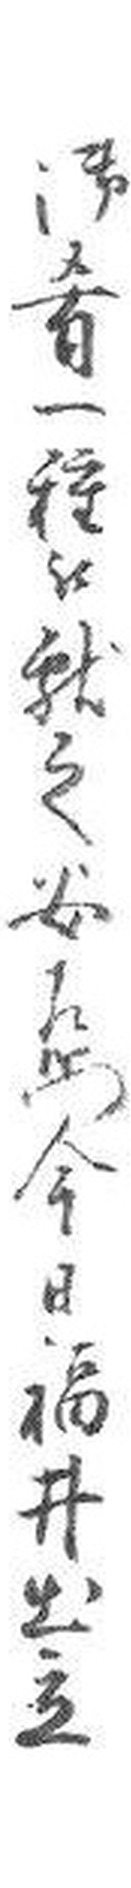御肴一種被献之安左衛門今日福井出立
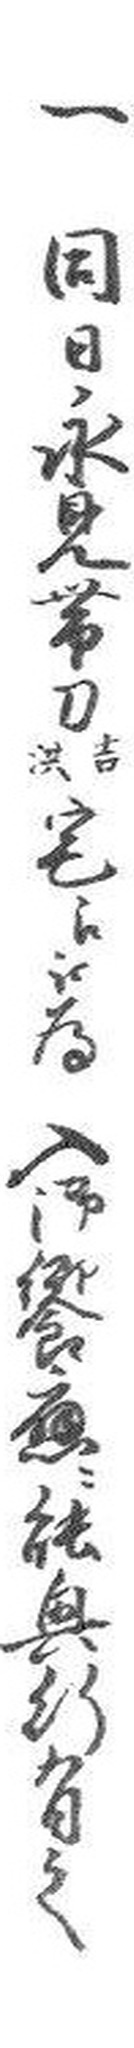一同日永見帯刀吉洪宅江被為入御饗応ニ能興行有之
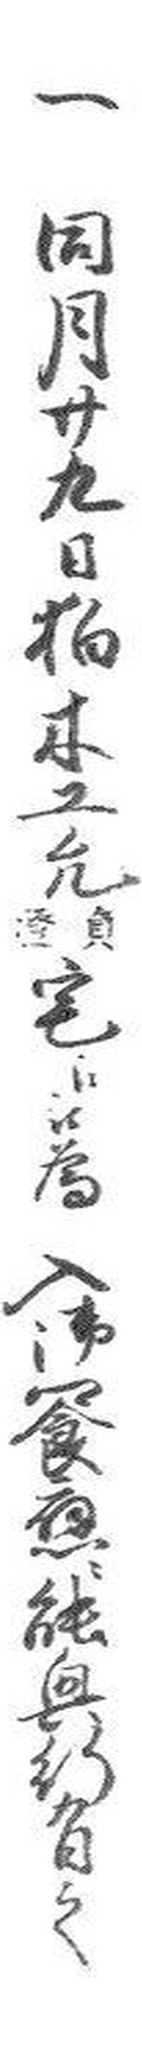一同月廿九日狛木工允貞澄宅江被為入御饗応ニ能興行有之
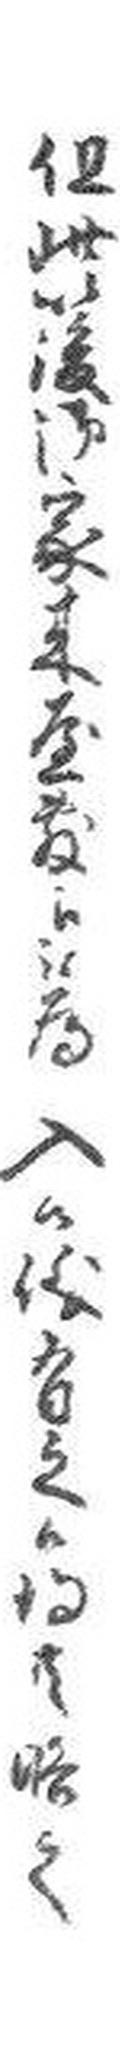但此以後御家来屋敷江被為入候儀有之候得共略之
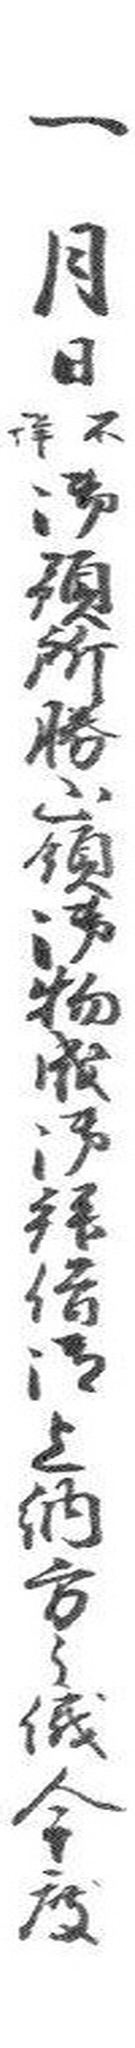一月日不詳御預所勝山領御物成御拝借御上納方之儀今度
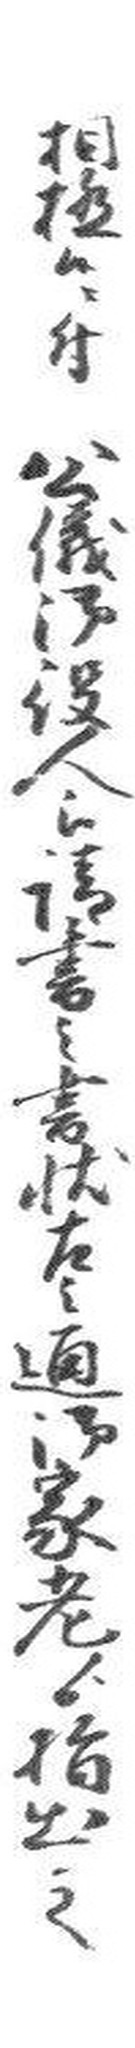相極候ニ付公儀御役人江請書之書状左之通御家老ゟ指出之
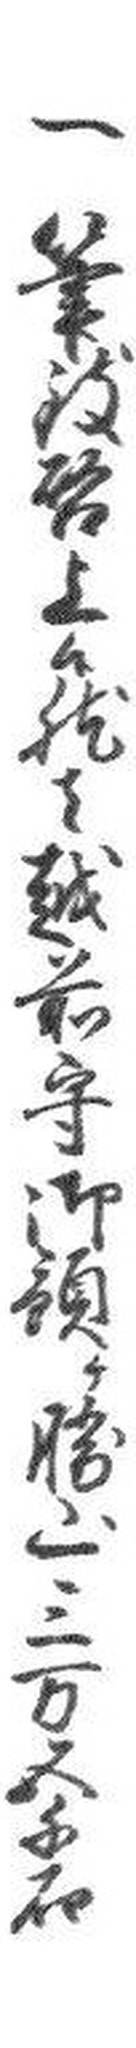一筆致啓上候然者越前守御預ヶ勝山三万五千石
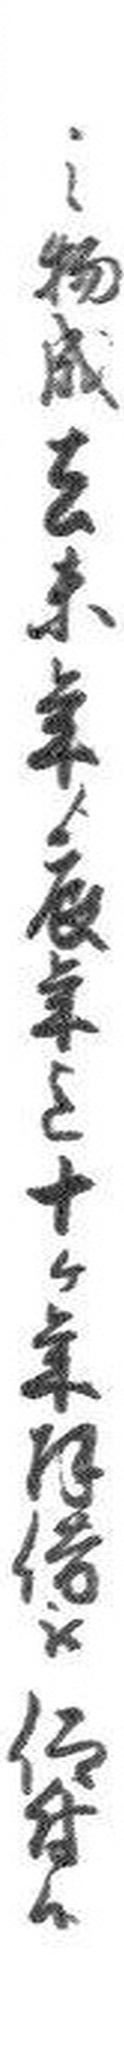之物成去未年ゟ辰年迄十ヶ年拝借被仰付候
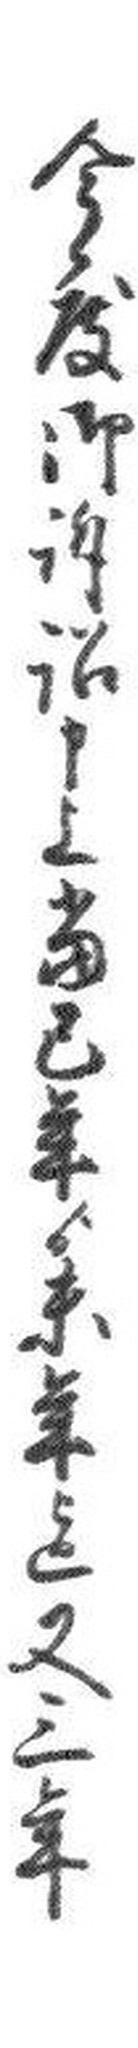今度御訴詔申上当巳年ゟ未年迄又三年
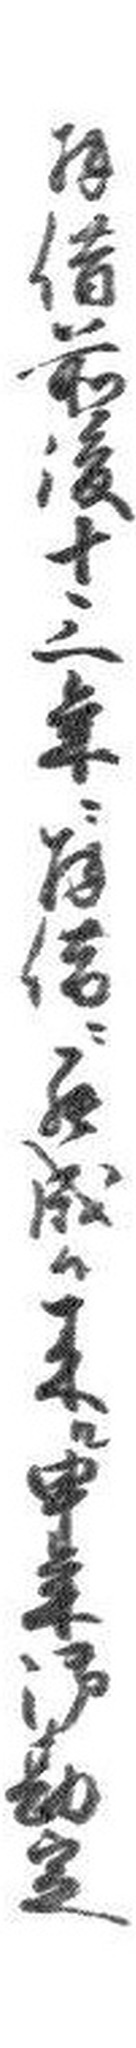拝借前後十三年ニ拝借ニ罷成候来ル申年御勘定
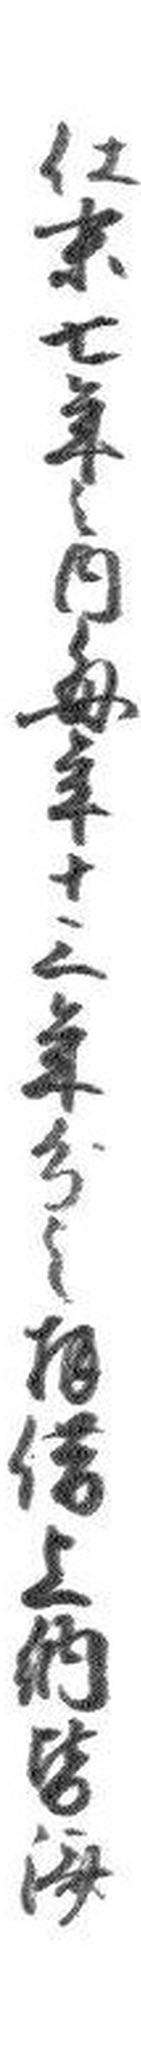仕末七年之内毎年十三年分之拝借上納皆済
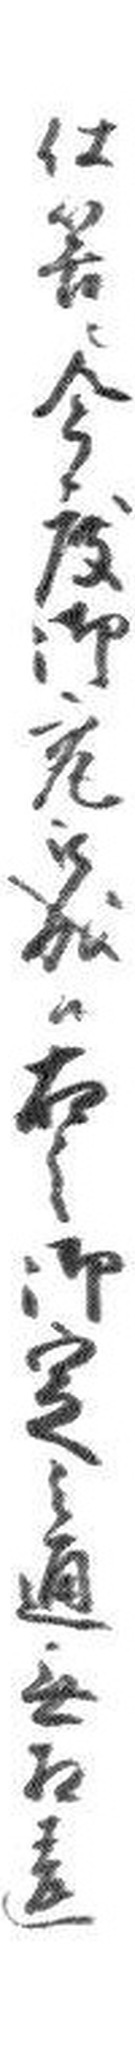仕筈ニ今度御究被成候右之御定之通無相違
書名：家譜 七 光通公 従寛文四年到同九年
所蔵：福井県文書館 Fukui Prefectural Archives
